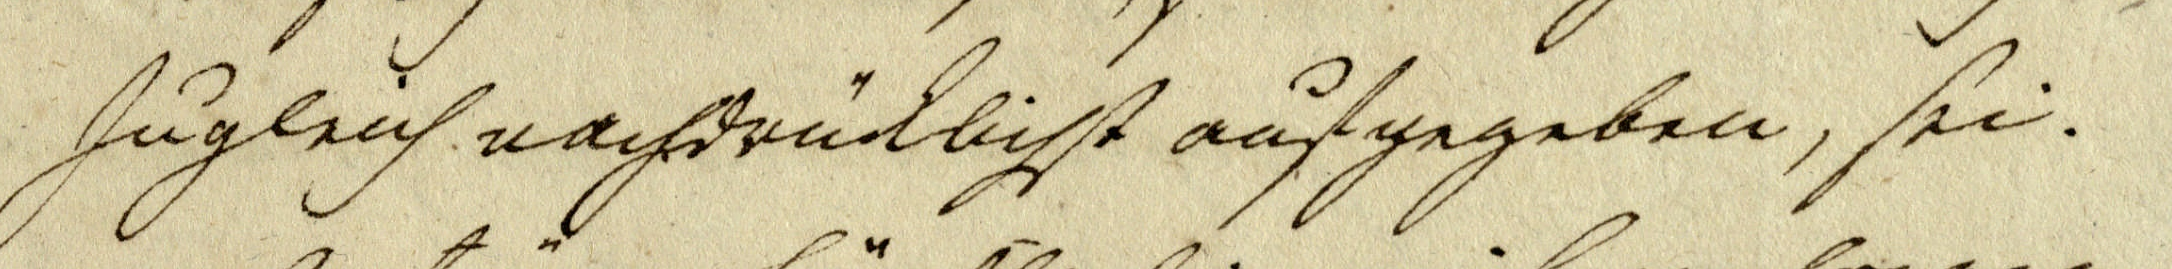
zugleich nachdrücklichst aufgegeben, sei¬
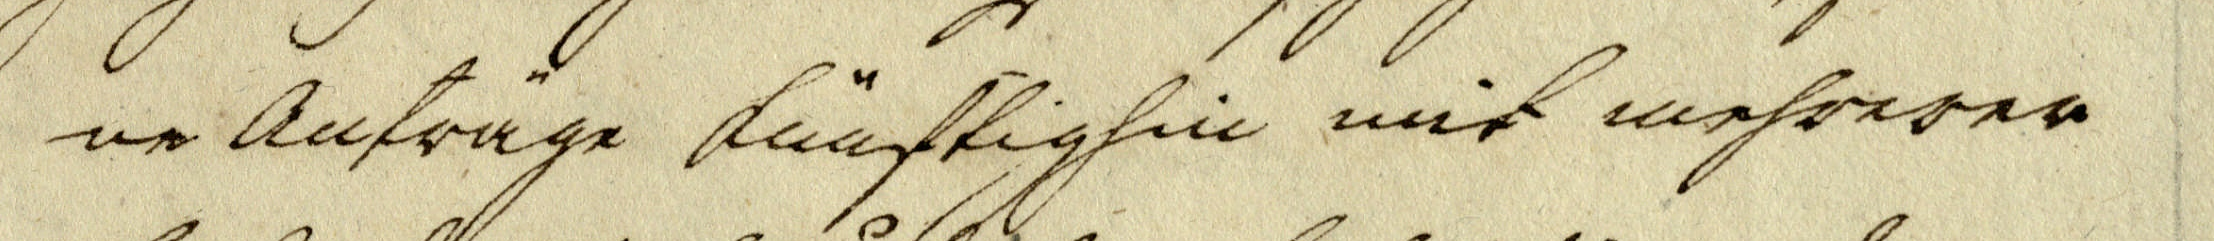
ne Anträge künftighin mit mehrerer
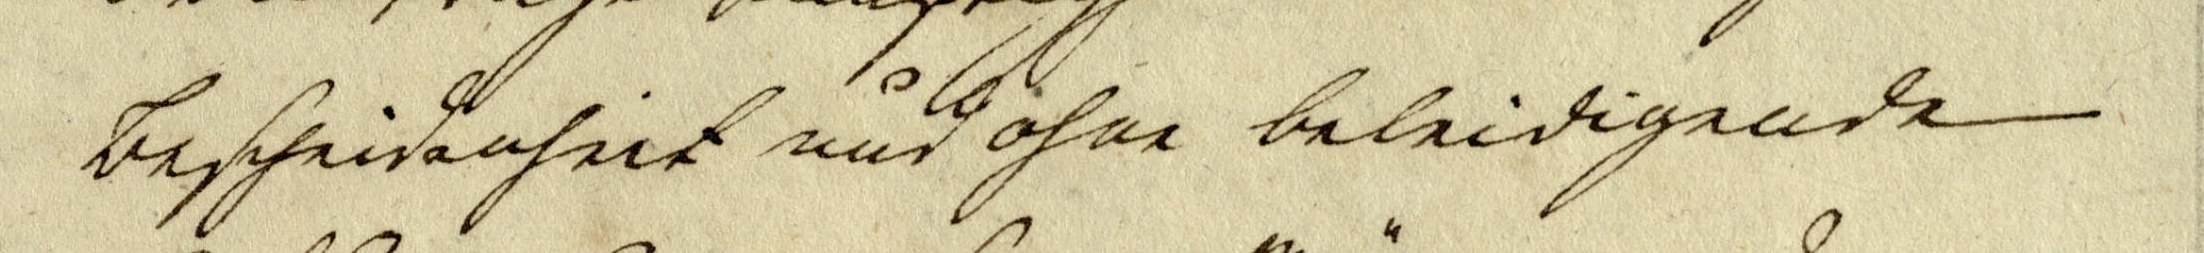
Bescheidenheit und ohne beleidigende
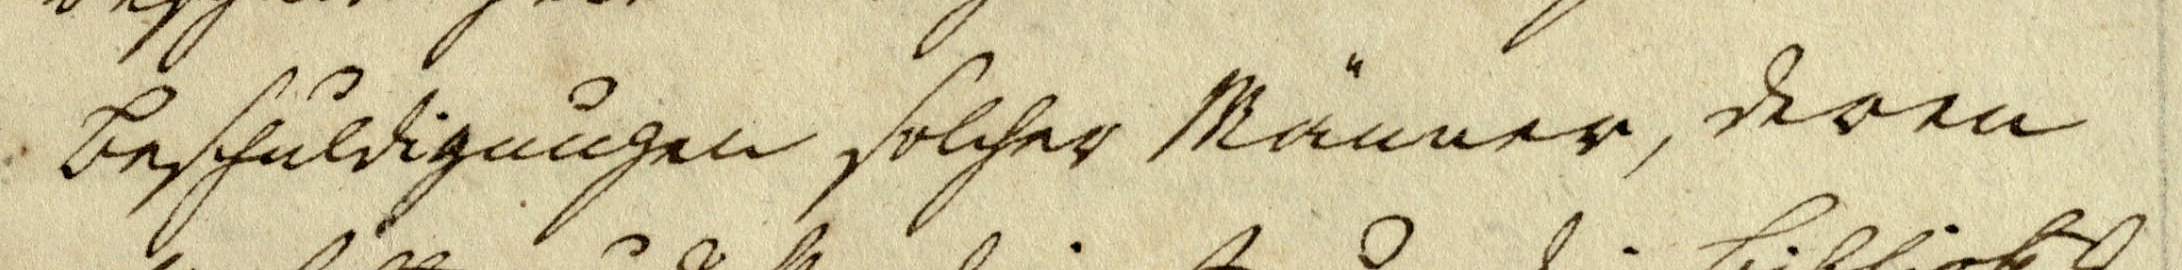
Beschuldigungen solcher Männer, deren
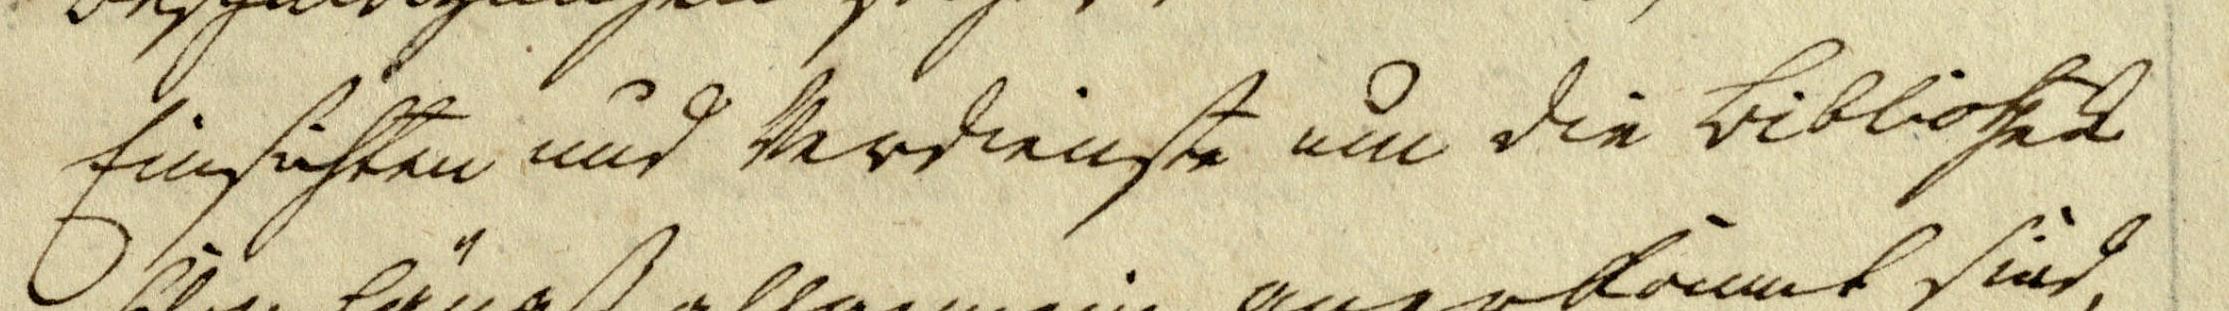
Einsichten und Verdienste um die Bibliothek
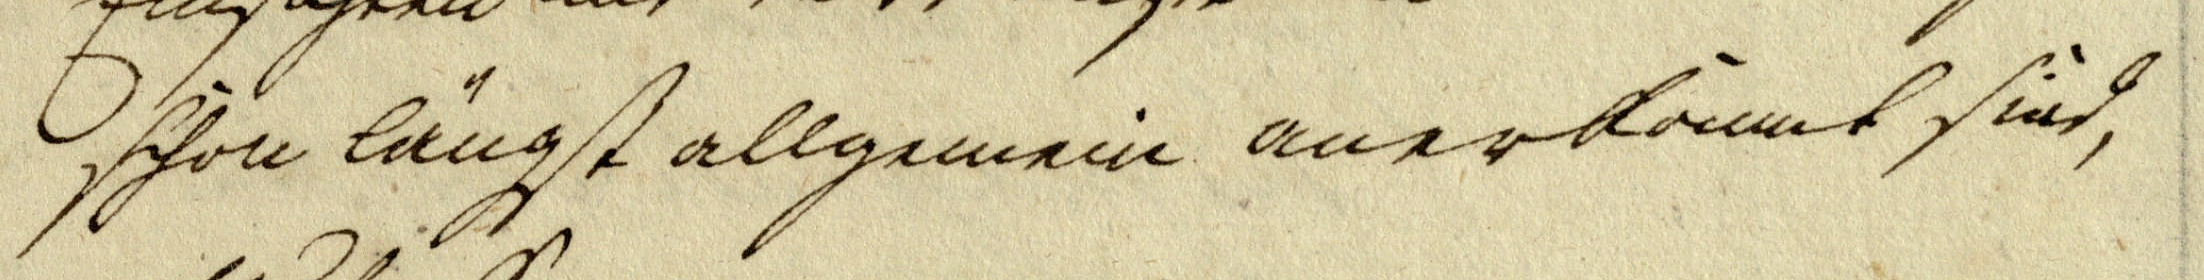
schon längst allgemein anerkannt sind,
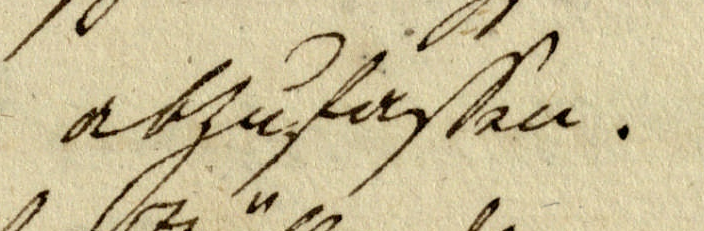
abzufassen.
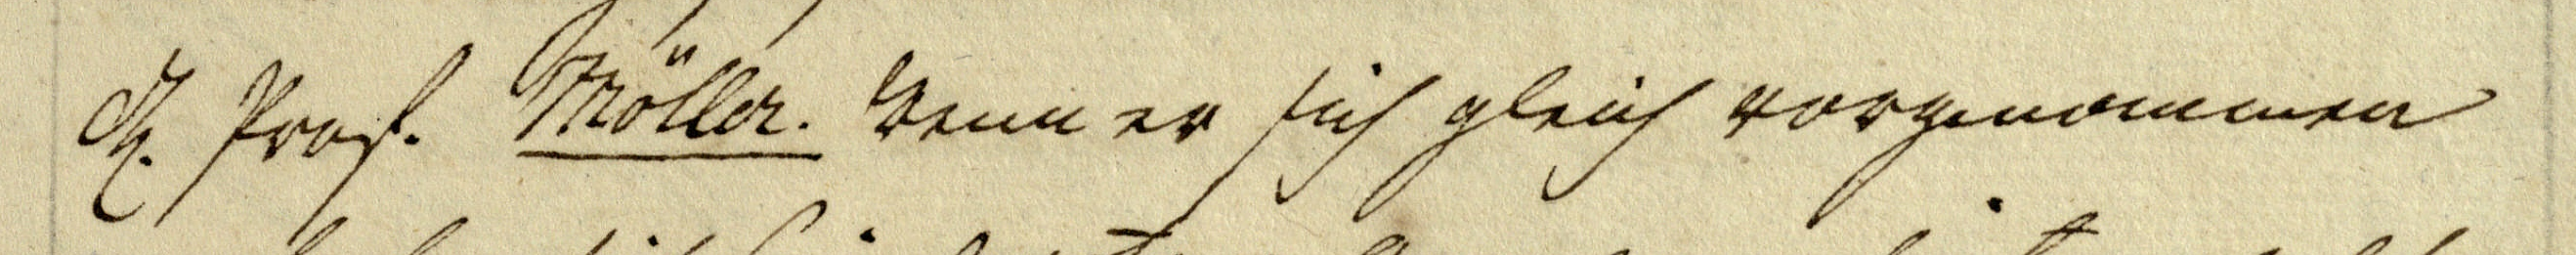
dh. Prof. Möller. Wenn er sich gleich vorgenommen
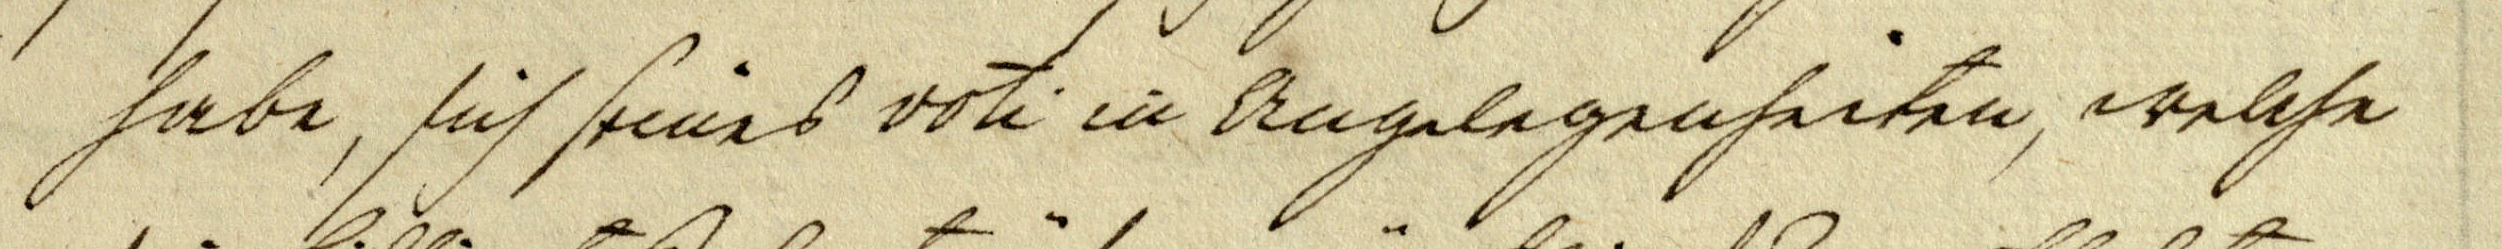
habe, sich seines voti in Angelegenheiten, welche
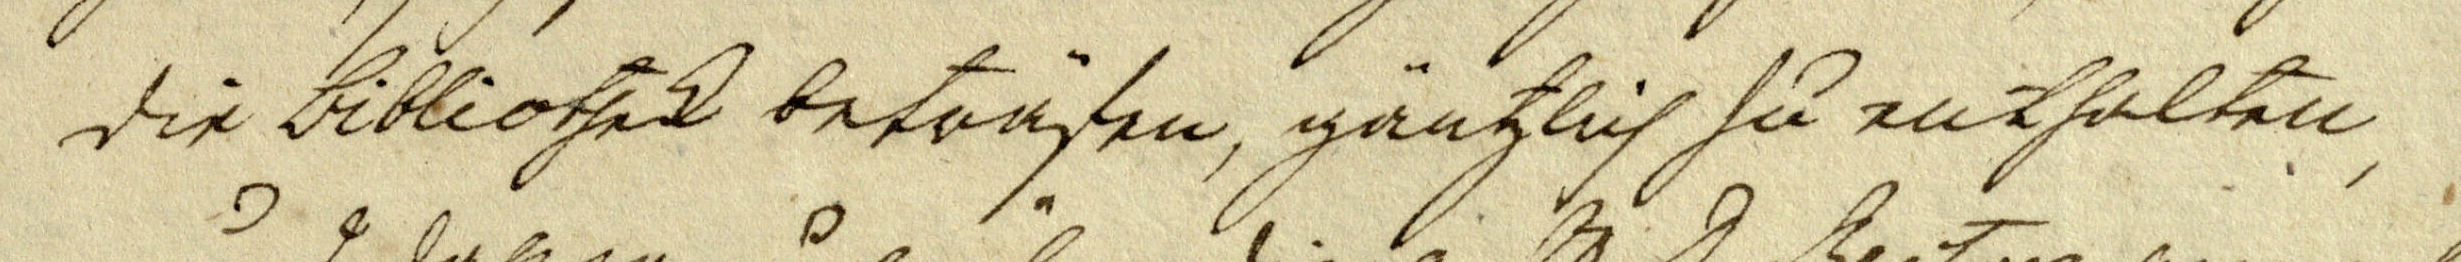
die Bibliothek beträfen, gäntzlich zu enthalten,
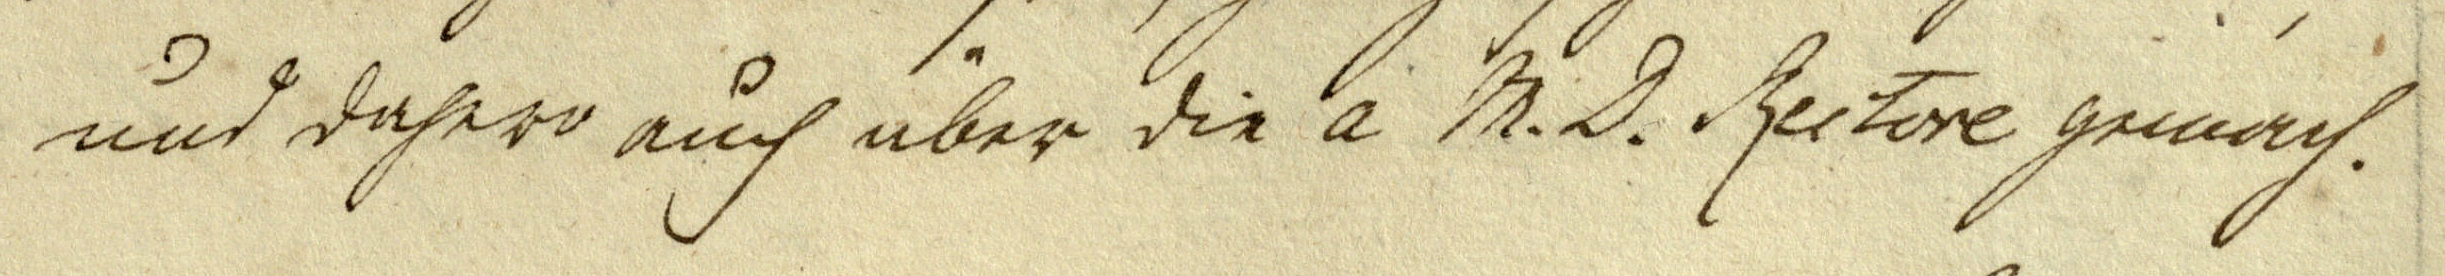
und dahero auch über die a M. D. Rectore gemach¬
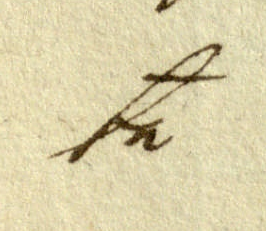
te
